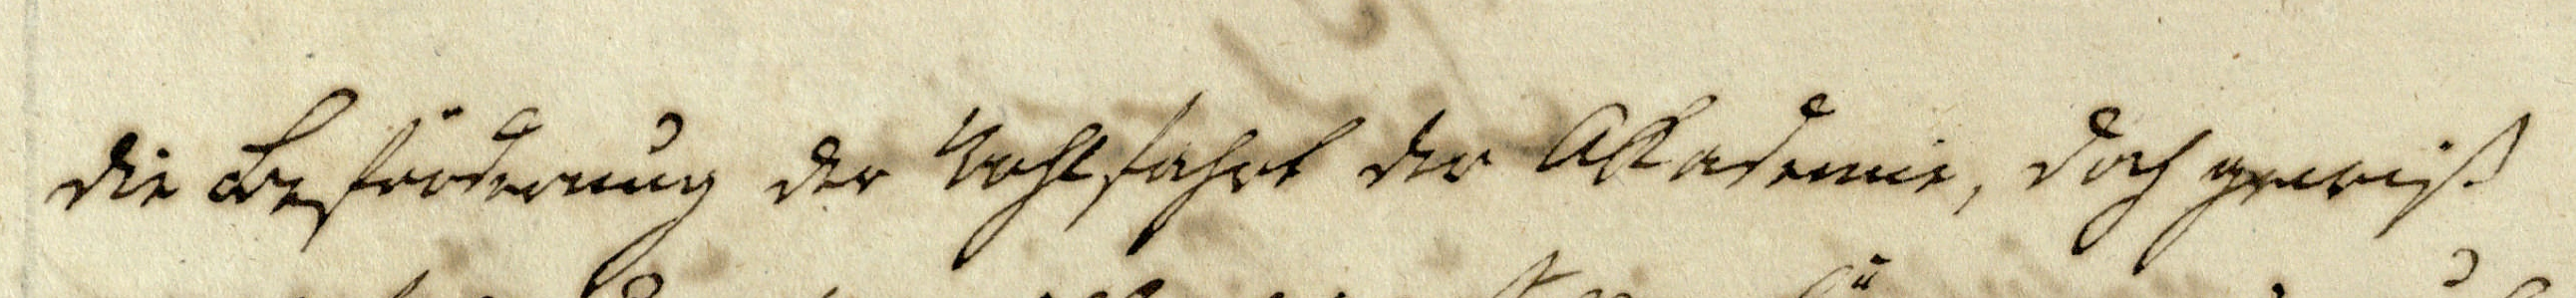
die Beförderung der Wohlfahrt der Akademie, doch gewiß
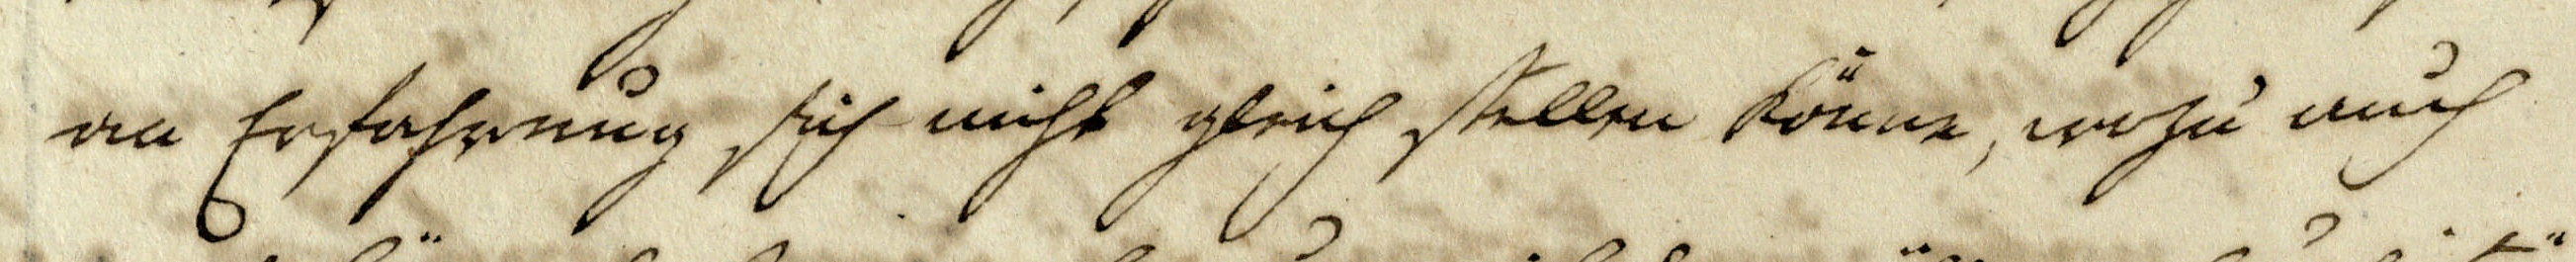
an Erfahrung sich nicht gleich stellen könne, wozu auch
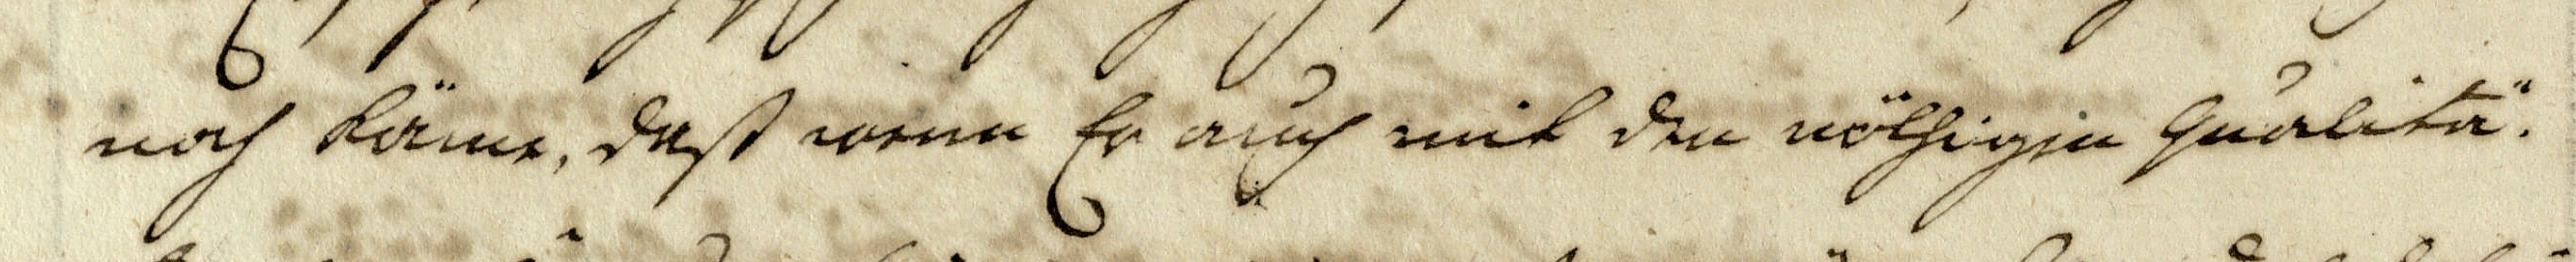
noch käme, daß wenn Er auch mit den nöthigen Qualitä¬
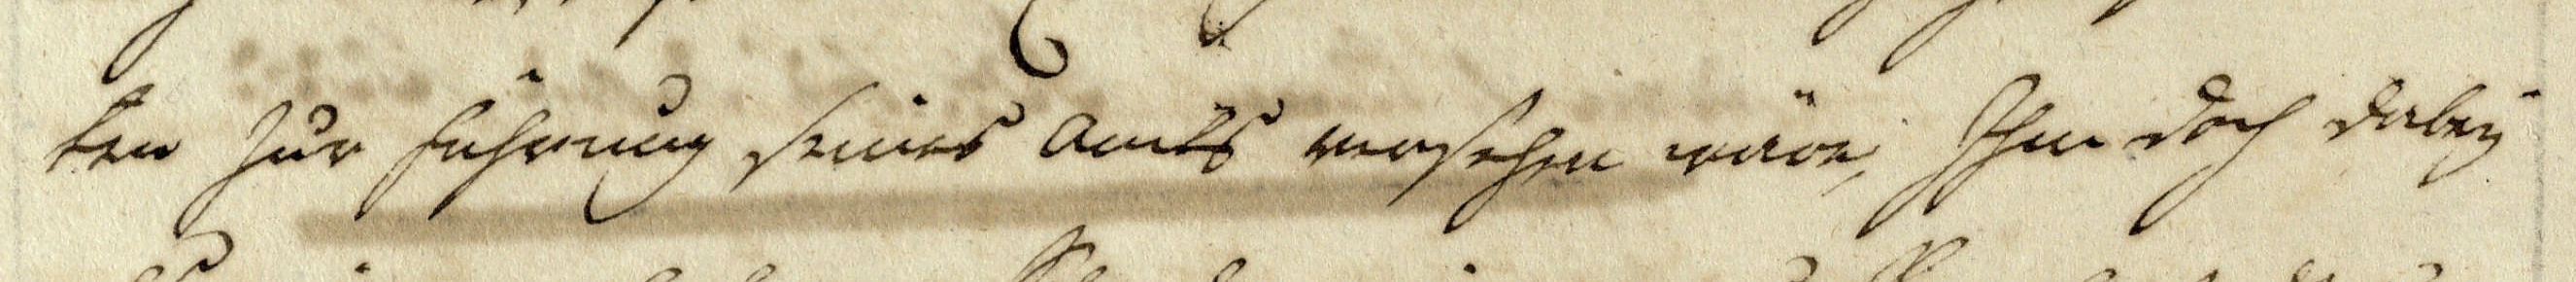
ten zur Führung seines Amts versehen wäre, Ihm doch dabeÿ
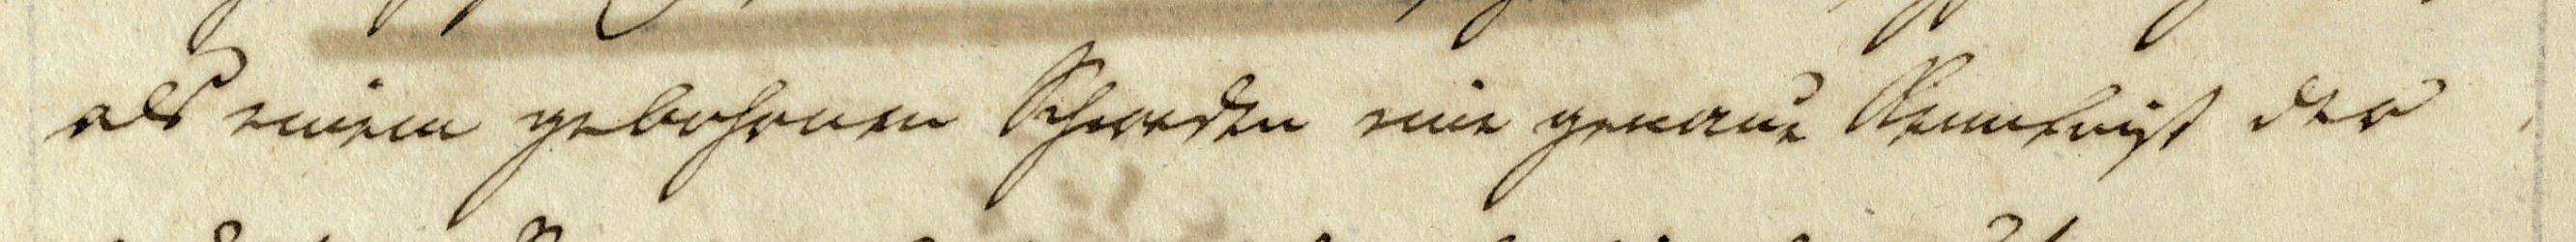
als einem gebohrnen Schweden eine genaue Kenntniß der
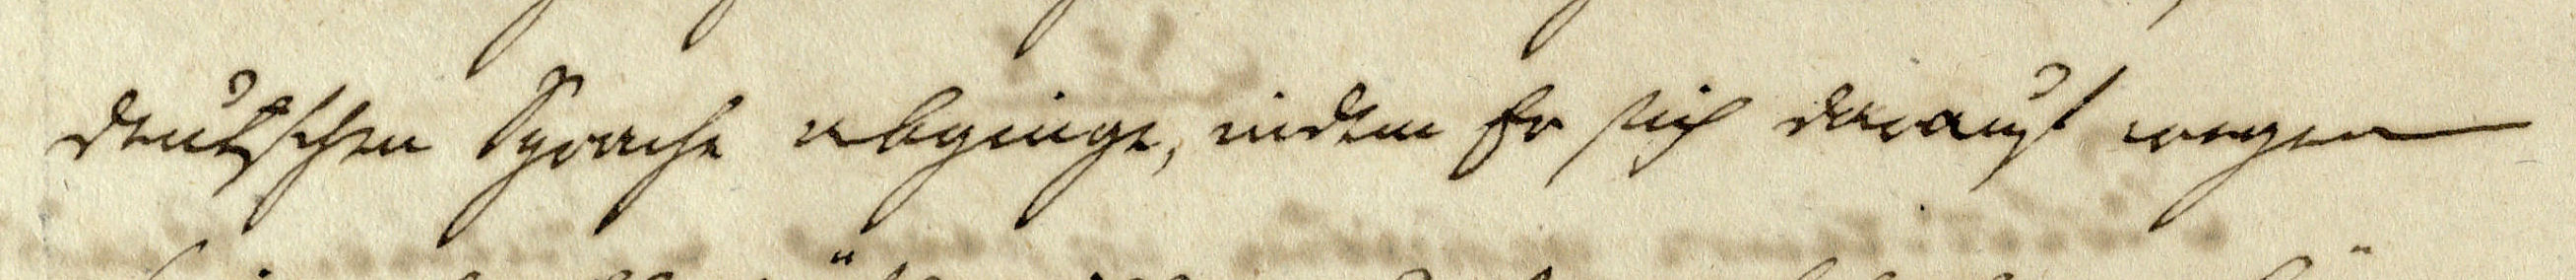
deutschen Sprache abginge, indem Er sich darauf wegen
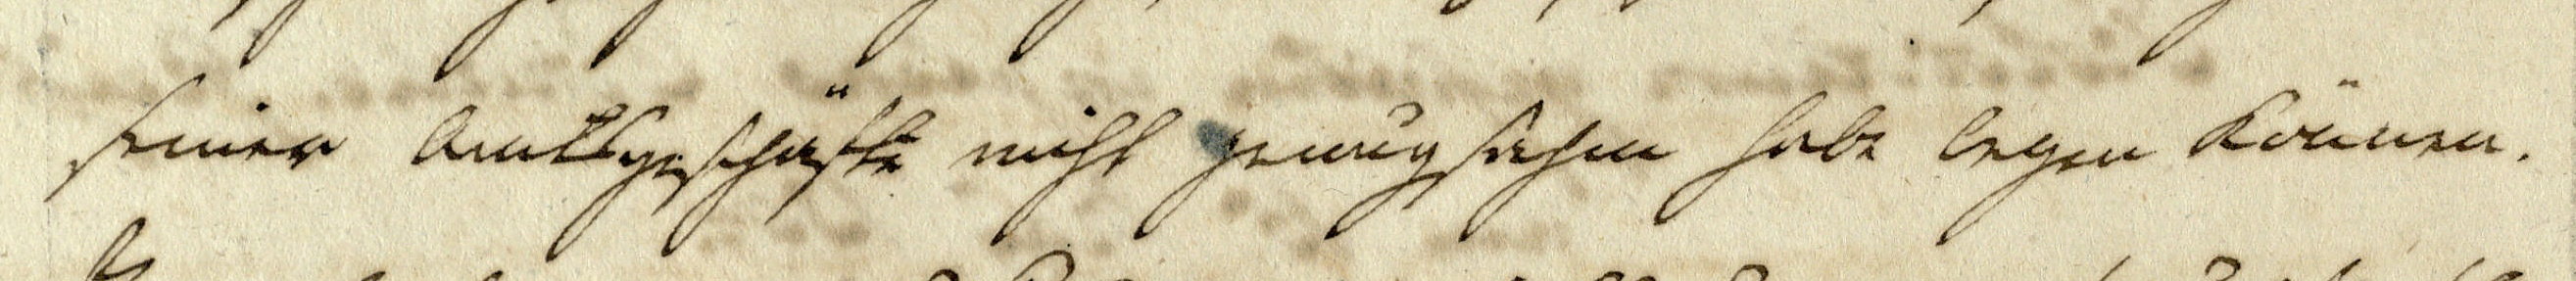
seiner Amtsgeschäfte nicht genugsahm habe legen können.
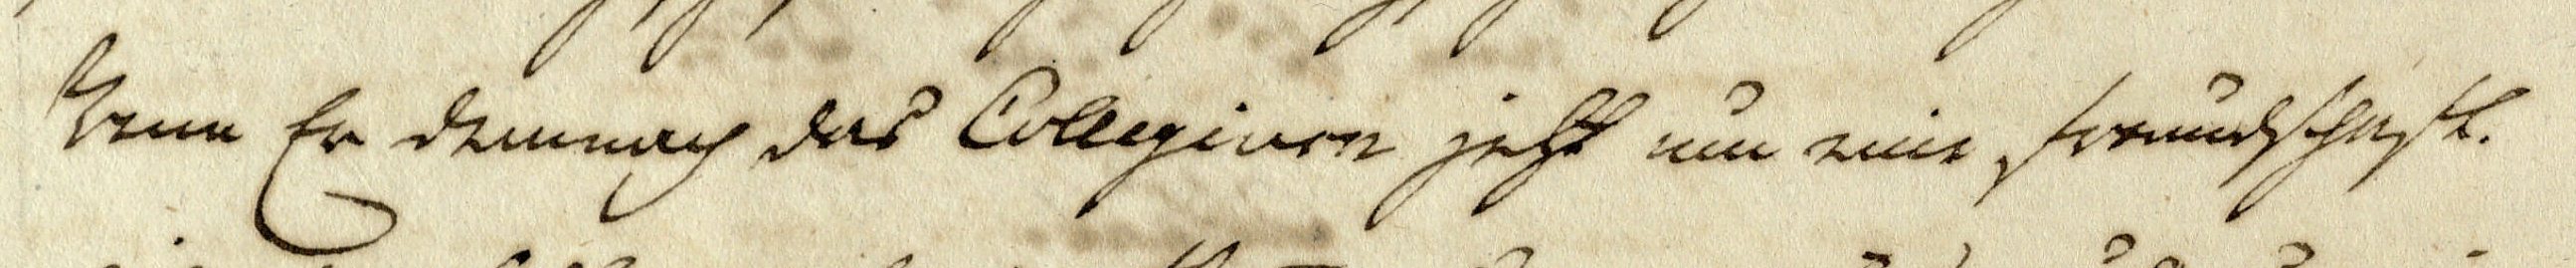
Wenn Er demnach das Collegium jetzt um eine freundschaft¬
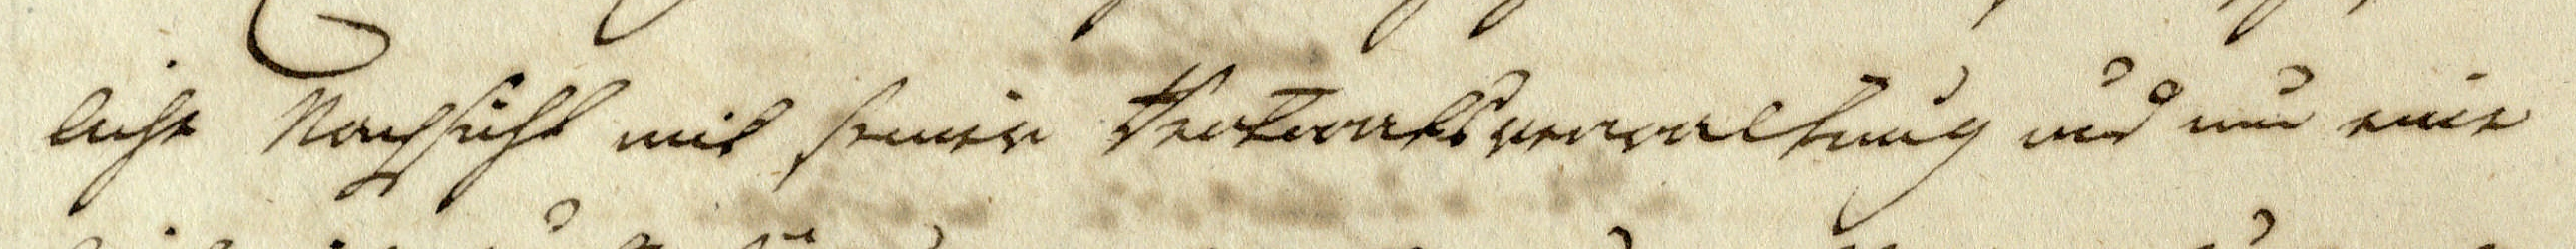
liche Nachsicht mit seiner Rectoratsverwaltung und um eine
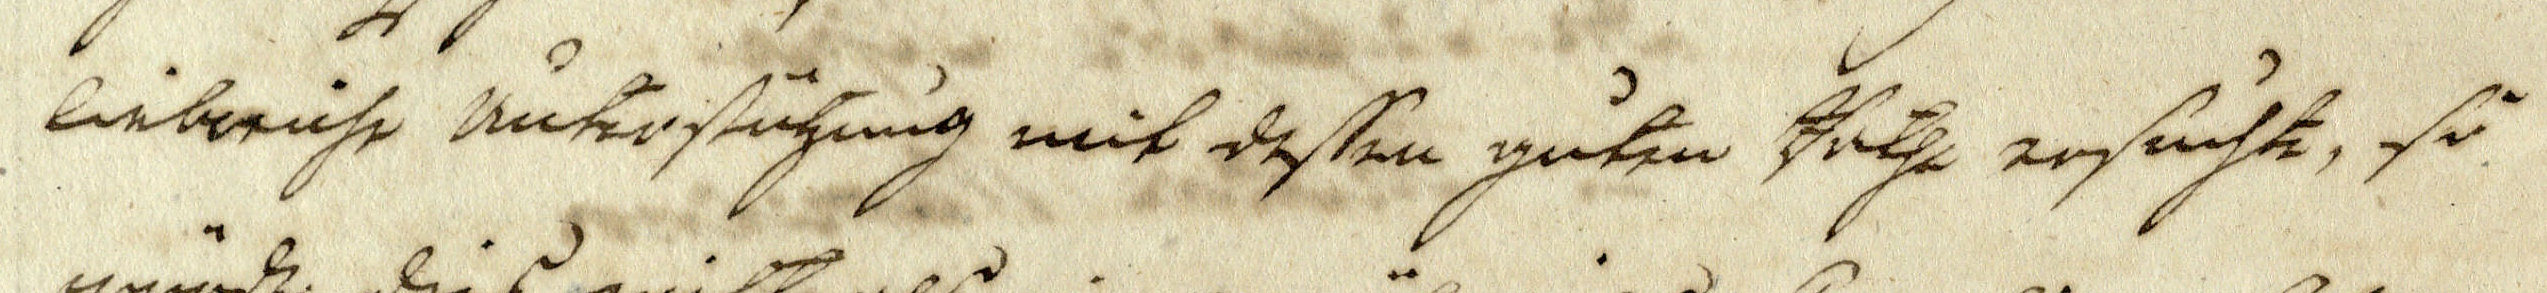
liebreiche Unterstützung mit dessem guten Rathe ersuchte, so
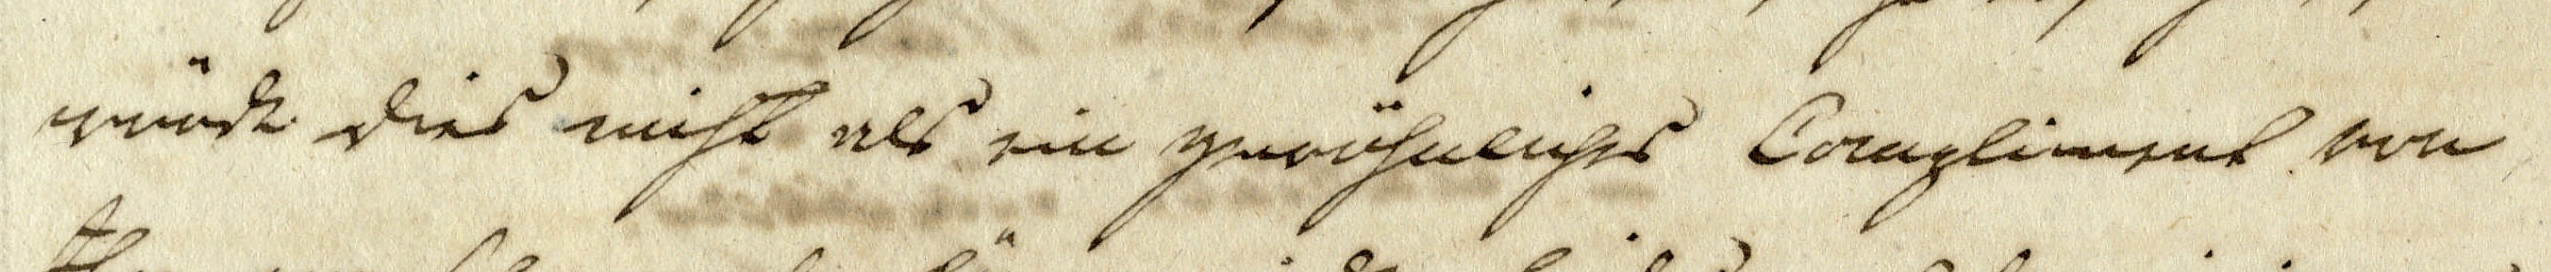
würde dies nicht als ein gewöhnliches Compliment von
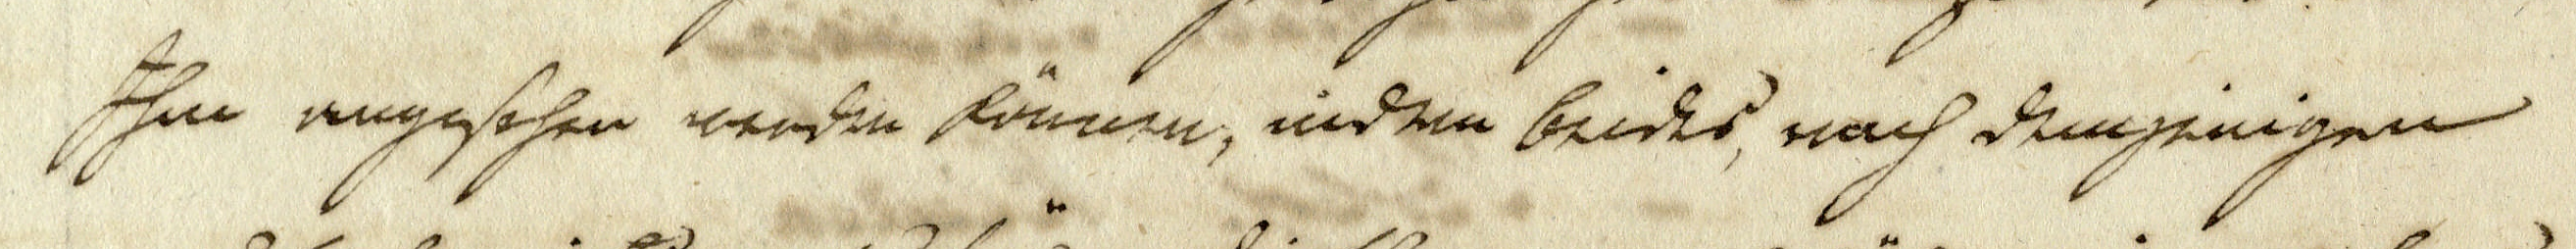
Ihm angesehen werden können, indem beides, nach demjenigen
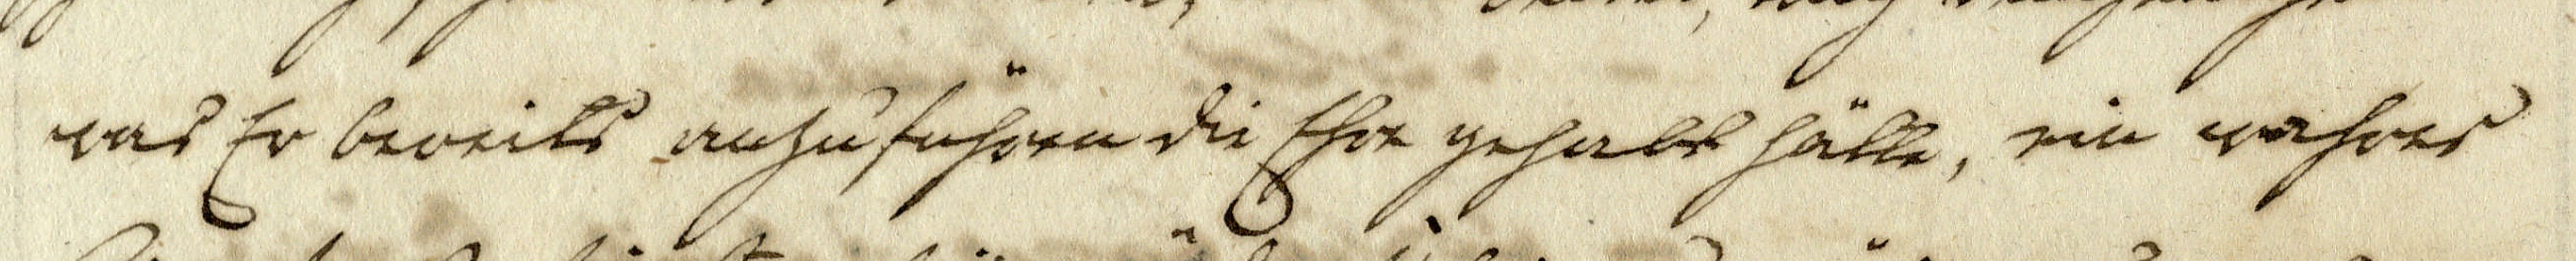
was Er bereits anzuführen die Ehre gehabt hätte, ein wahres
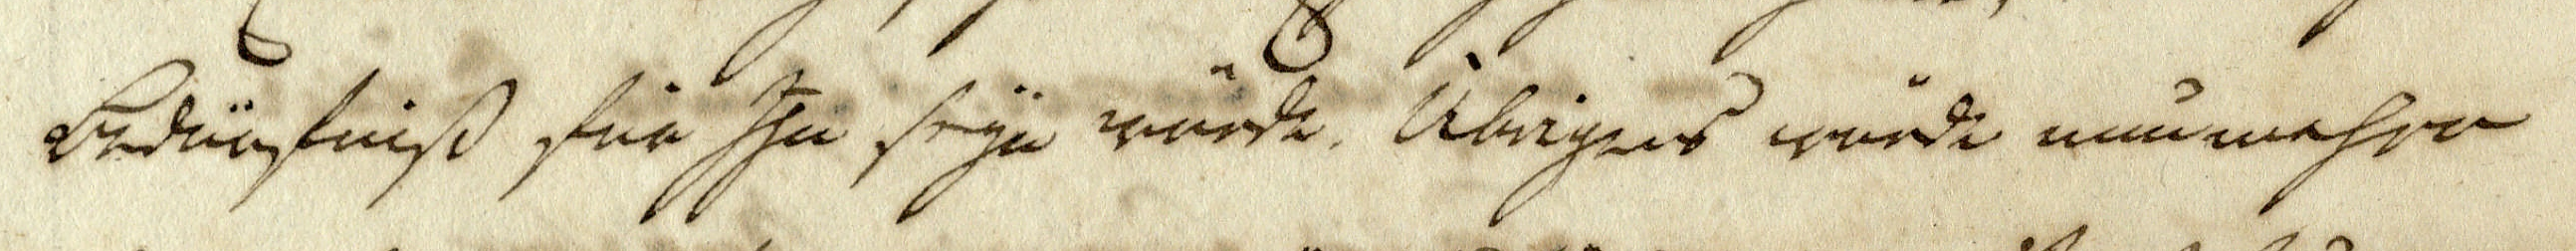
Bedürfniß für Ihn seÿn würde. Übrigens würde nunmehro
